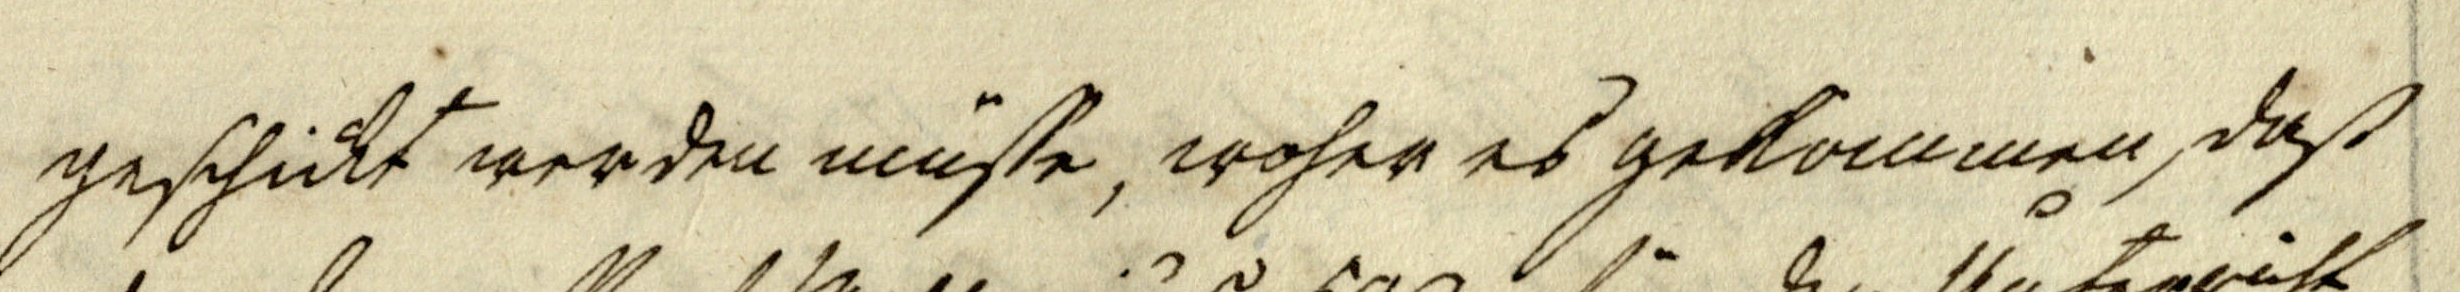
geschickt werden müsse, woher es gekommen, daß
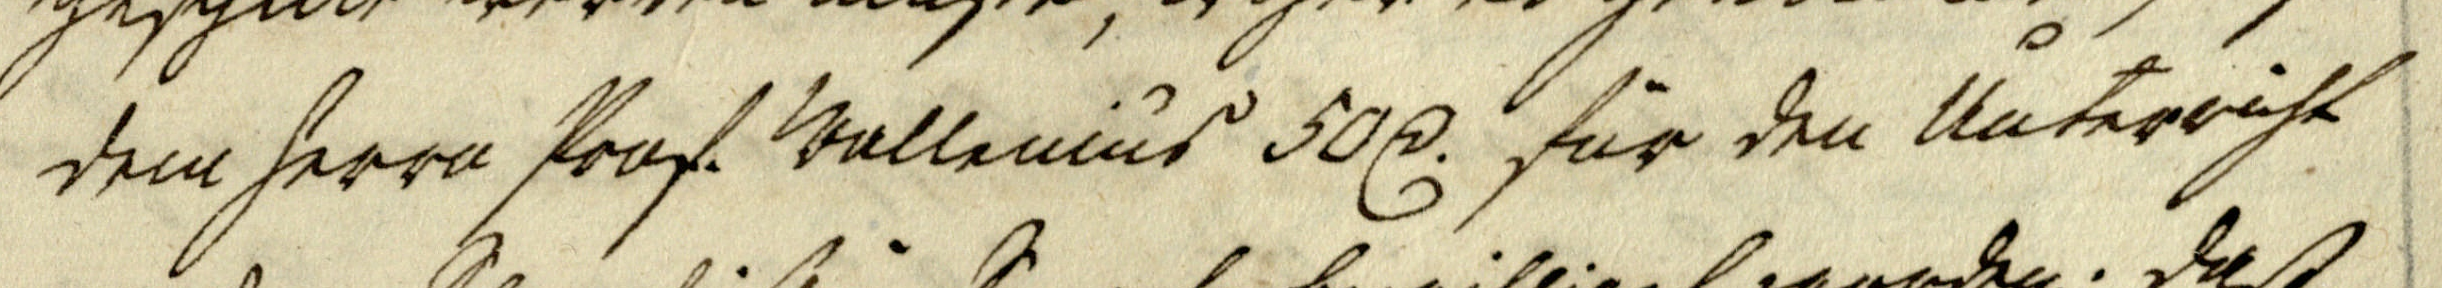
dem Herrn Prof. Wallenius 50 l. für den Unterricht
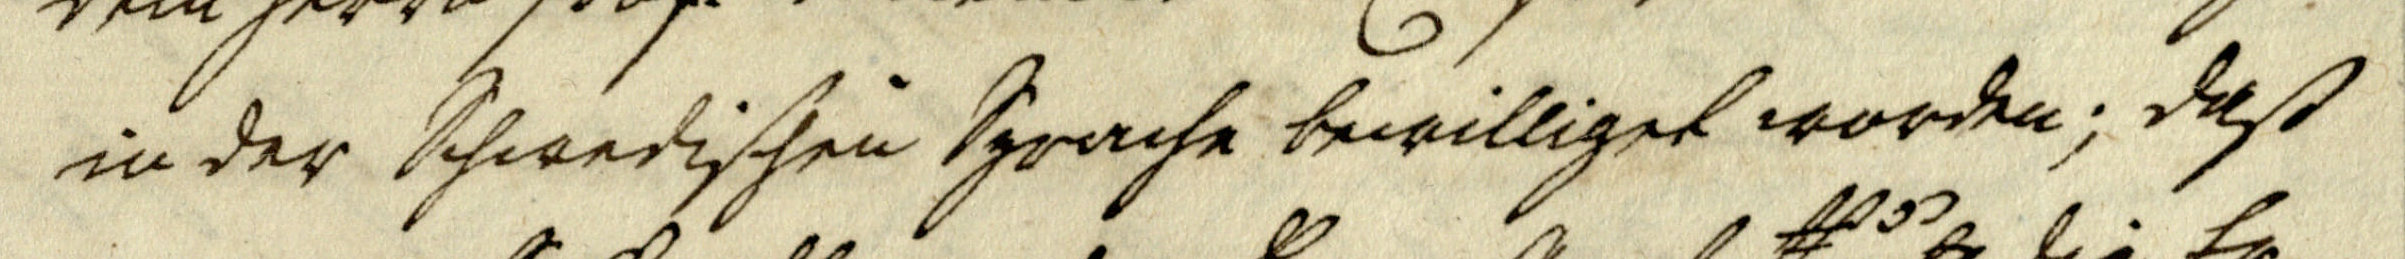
in der Schwedischen Sprache bewilliget worden; daß
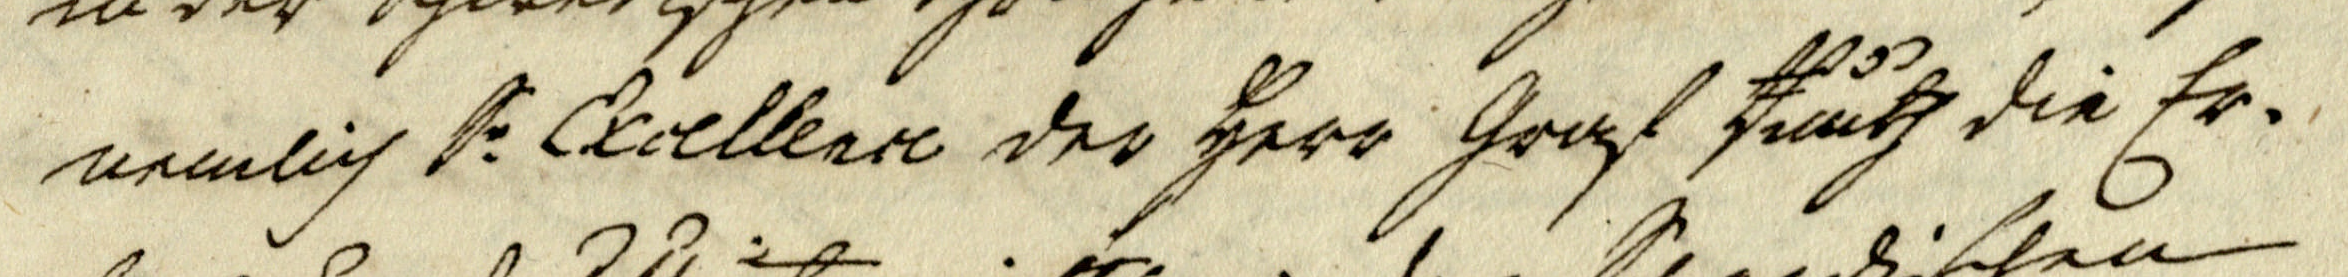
nemlich Sr Excellence der Herr Graf Ruuth die Er¬
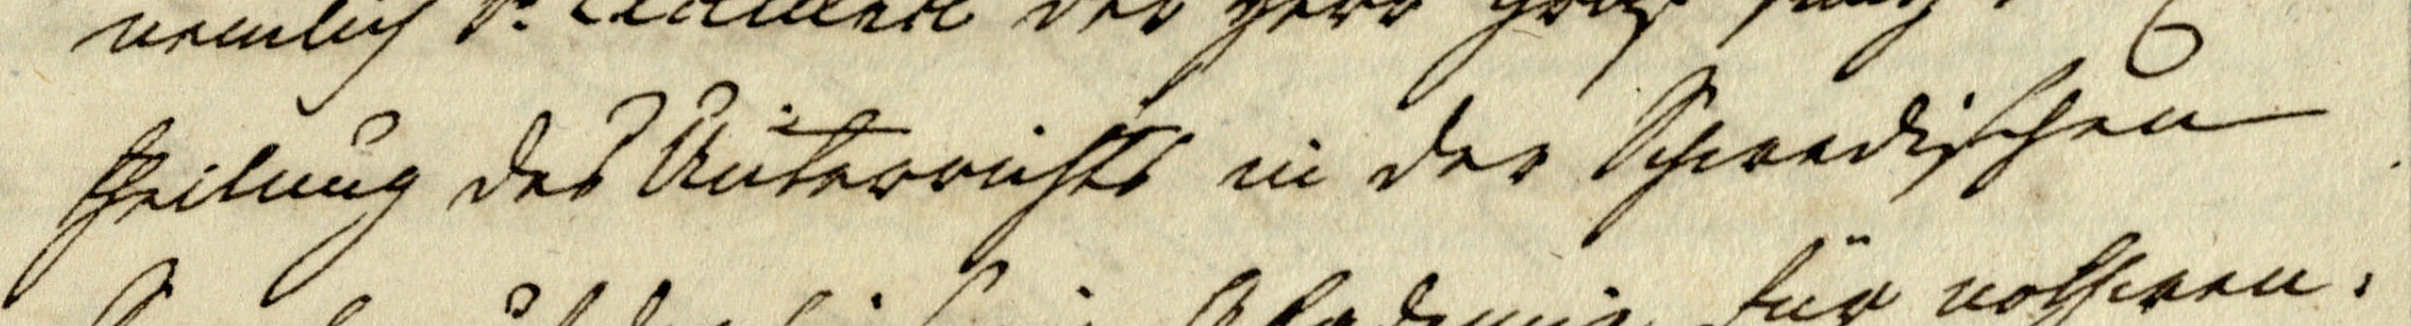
theilung des Unterrichts in der Schwedischen
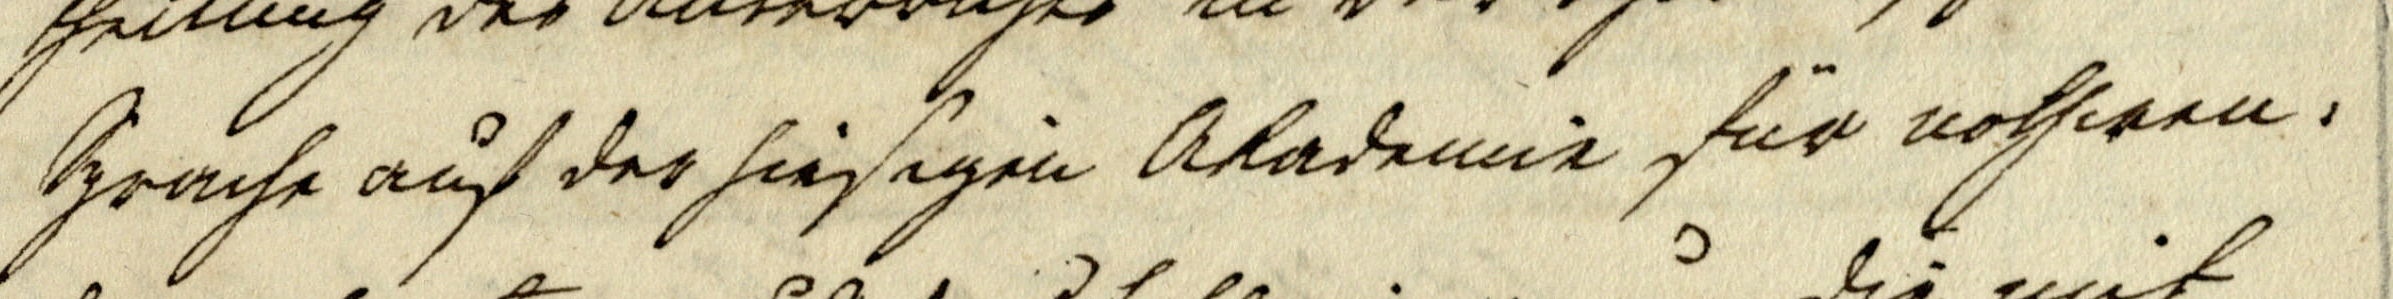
Sprache auf der hiesigen Akademie für nothwen¬
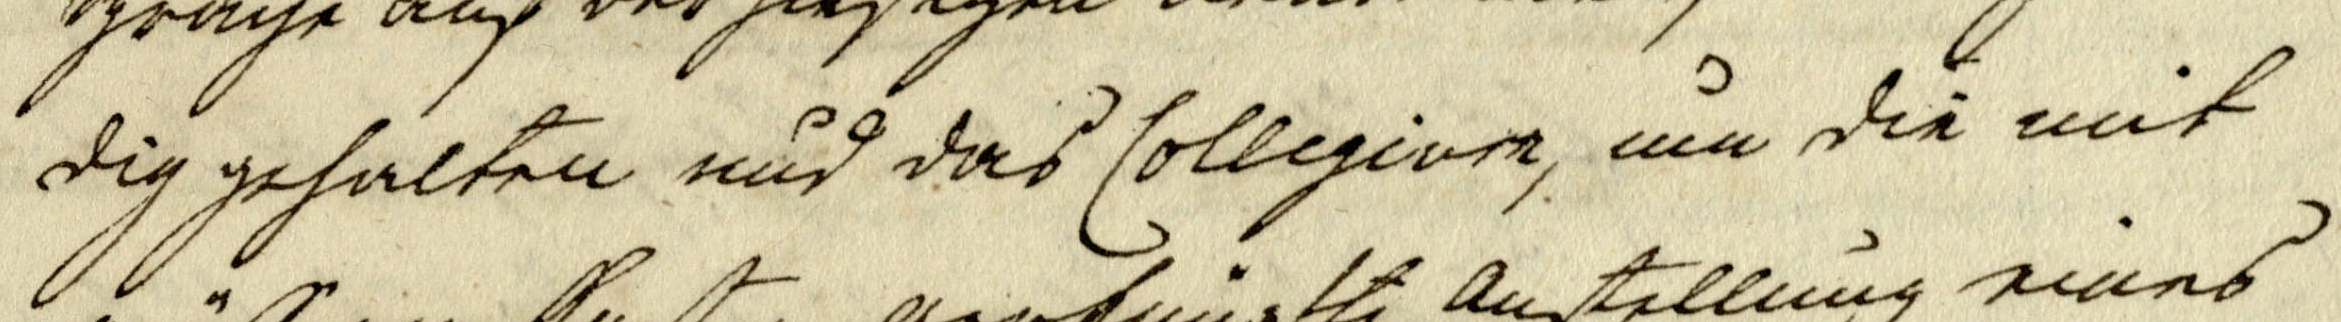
dig gehalten und das Collegium, um die mit
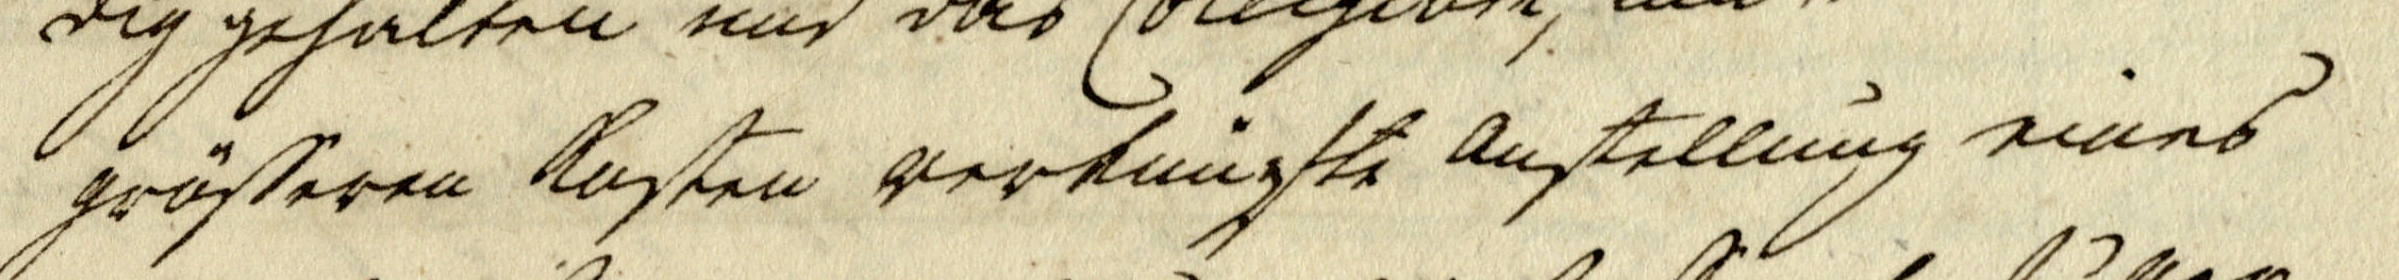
grösseren Kosten verknüpfte Anstellung eines
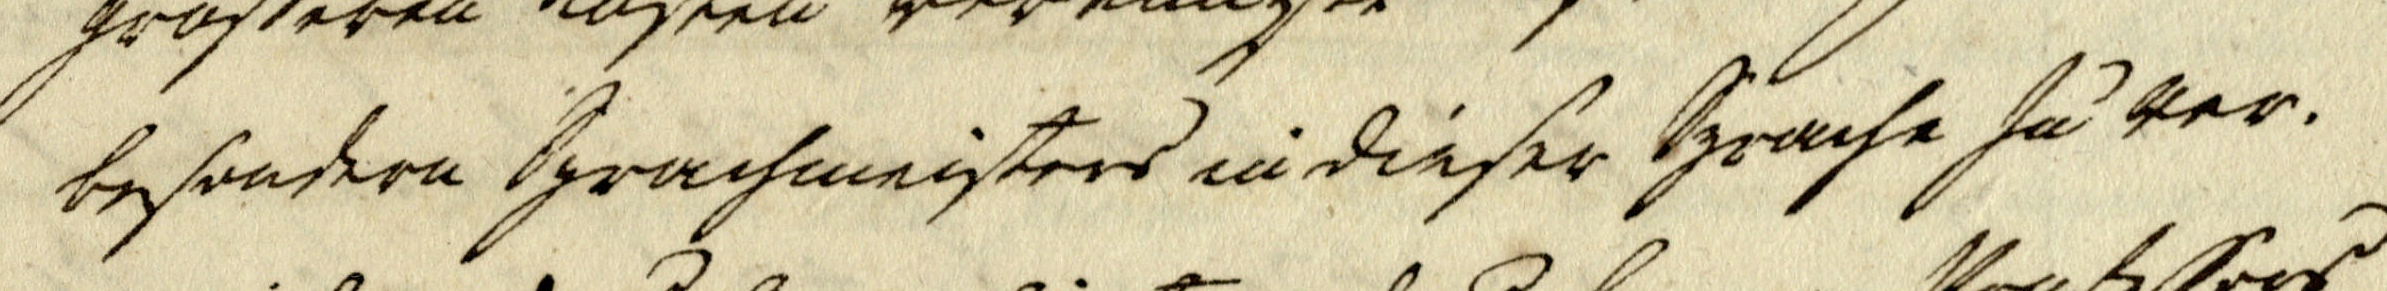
besondern Sprachmeisters in dieser Sprache zu ver¬
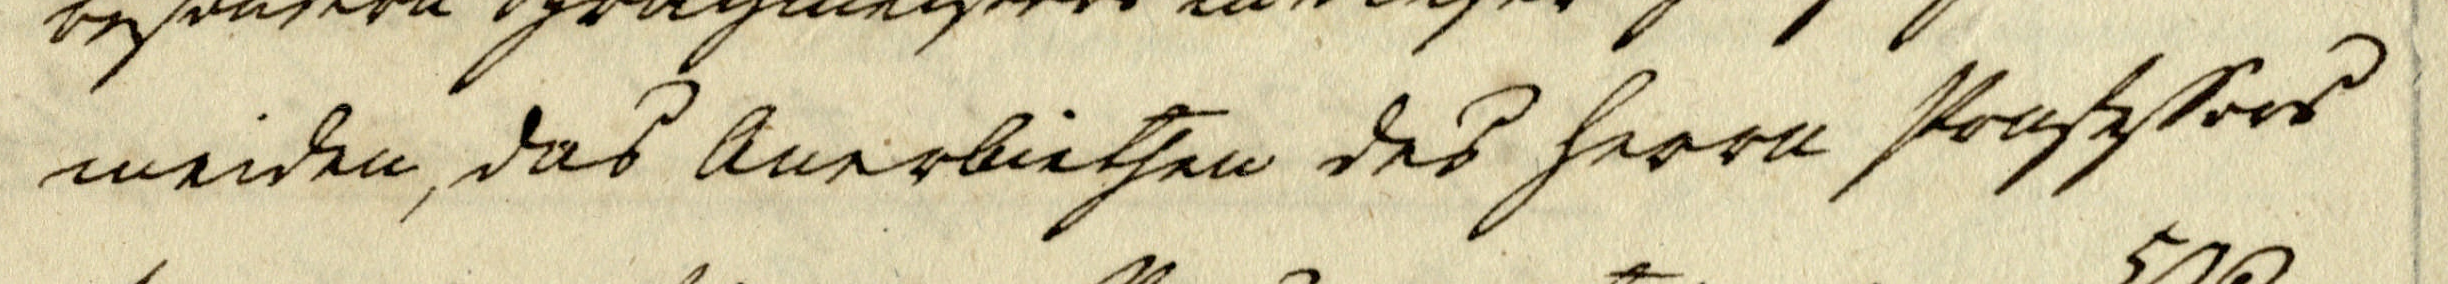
meiden, das Anerbiethen des Herrn Professors
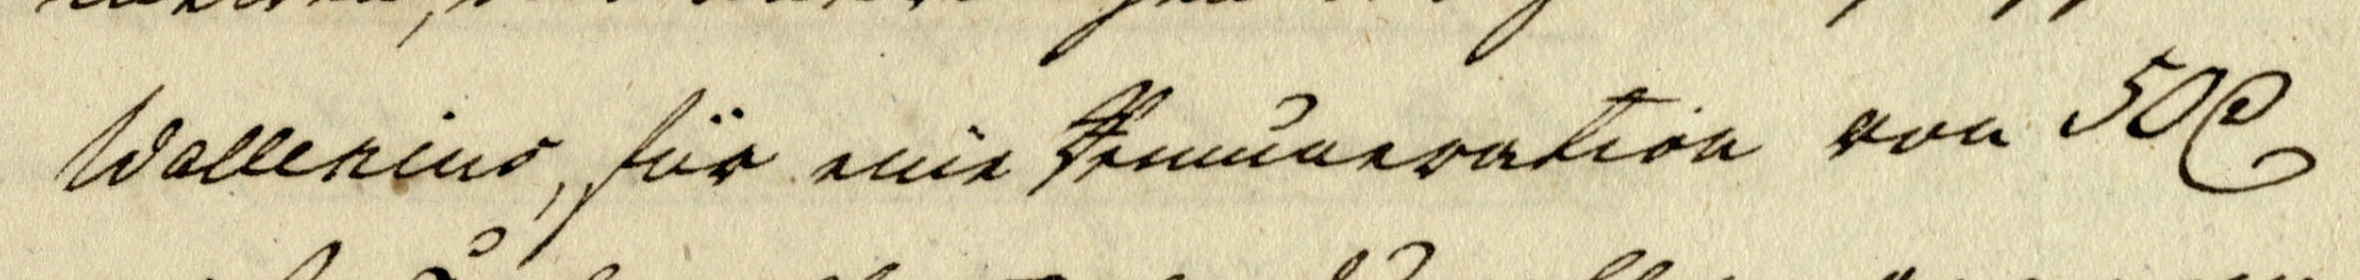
Wallenius, für eine Remuneration von 50 l.
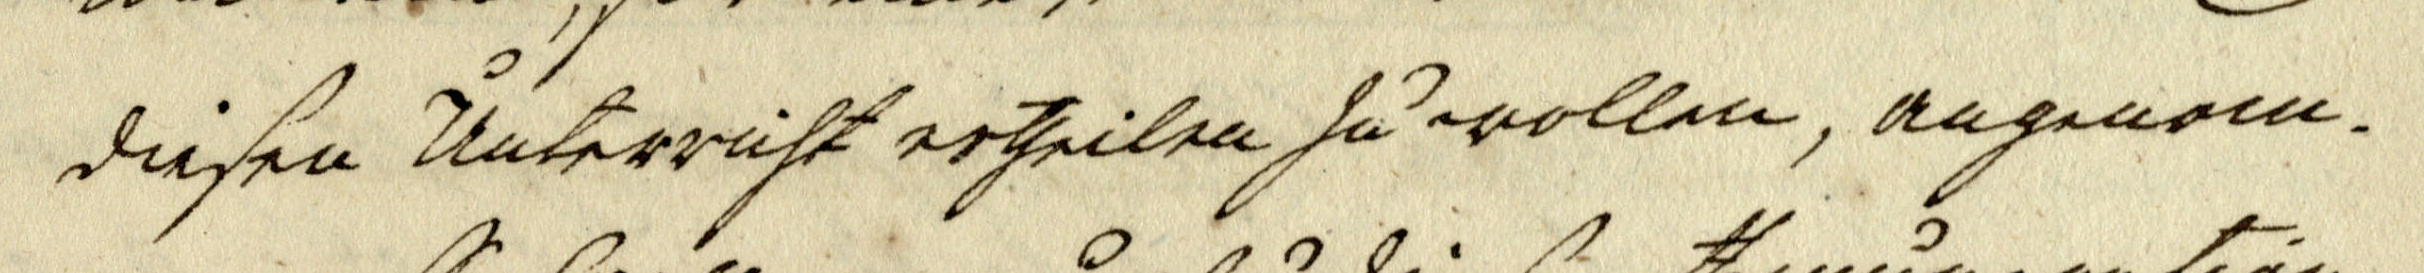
diesen Unterricht ertheilen zu wollen, angenom¬
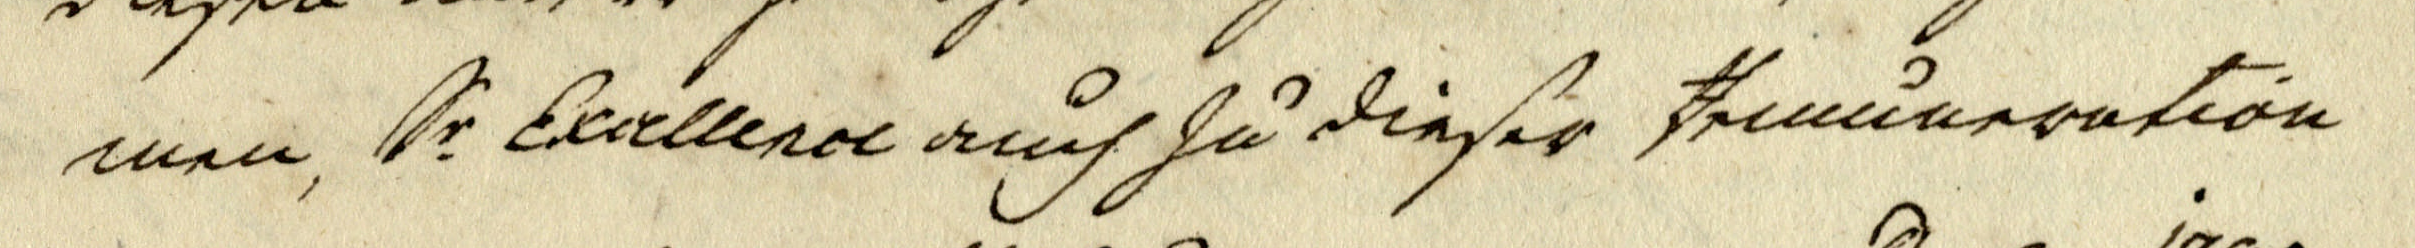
men, Sr Excellence auch zu dieser Remuneration
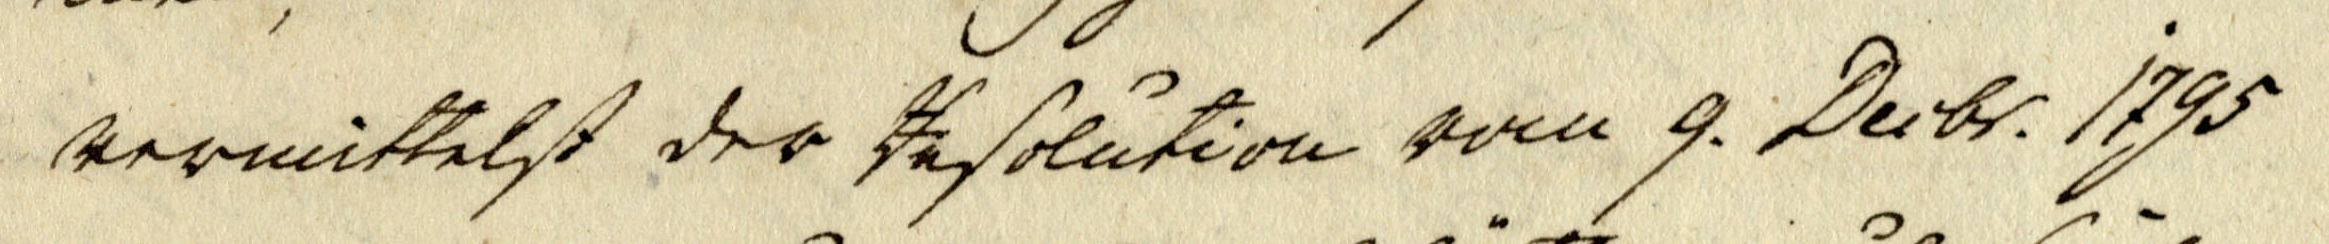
vermittelst der Resolution vom 9. Decbr. 1795
